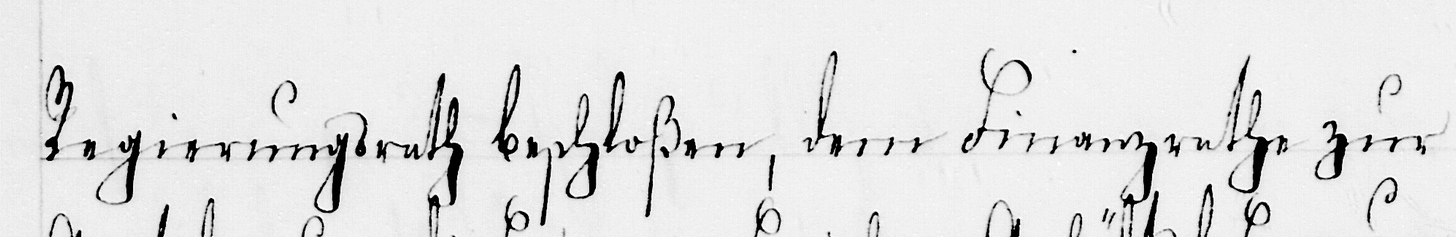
Regierungsrath beschloßen, dem Finanzrathe zur
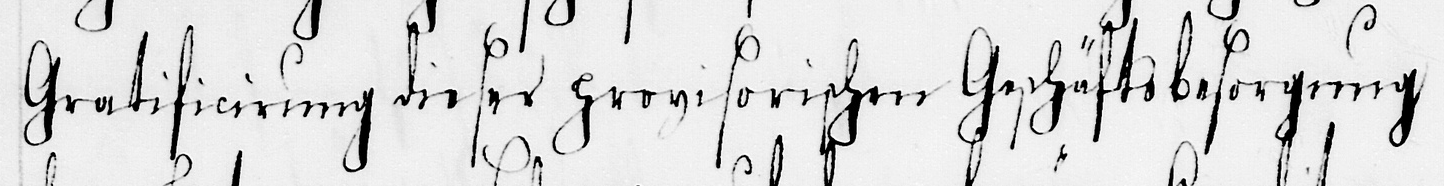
Gratificirung dieser provisorischen Geschäftsbesorgung
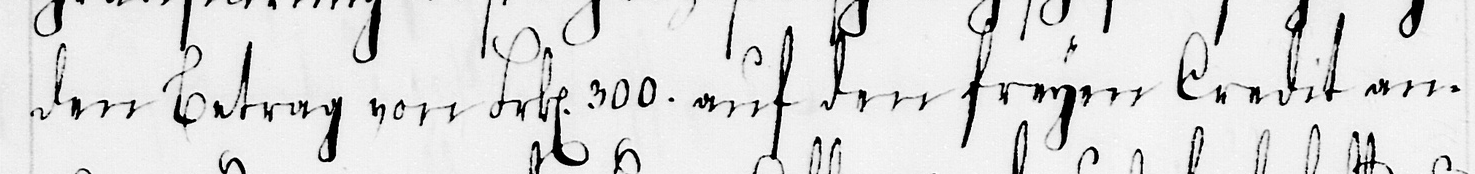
den Betrag von Frk[en]. 300. auf den freyen Credit an¬
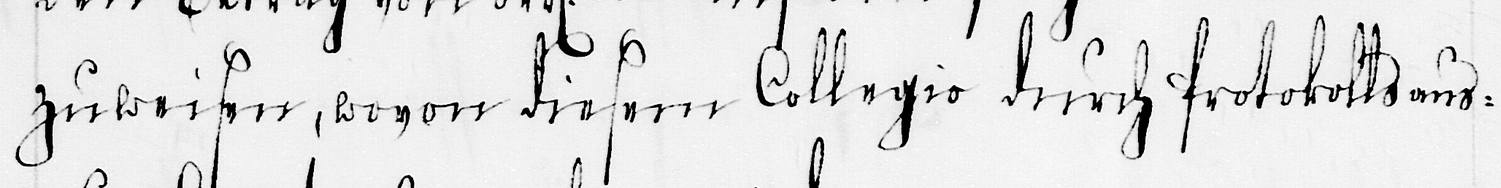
zuweisen, wovon diesem Collegio durch Protokollsaus¬
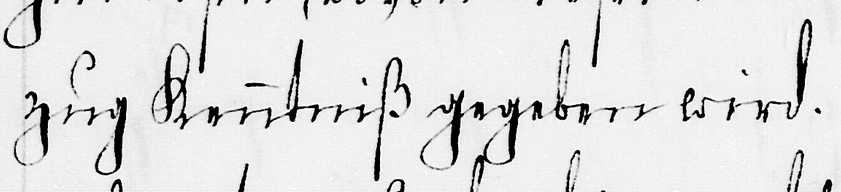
zug Kenntniß gegeben wird.
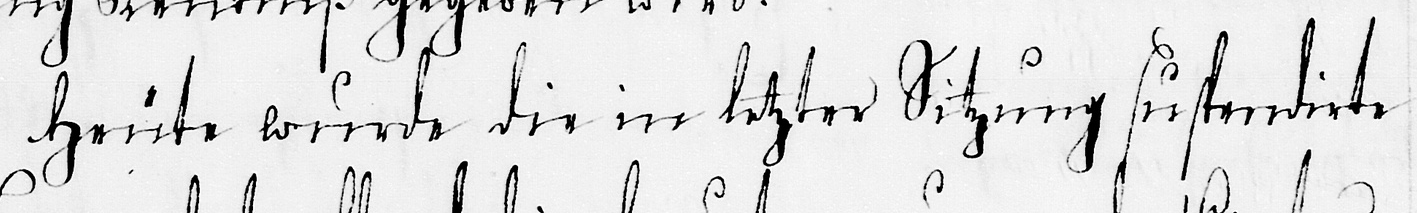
Heute wurde die in letzter Sitzung suspendirte
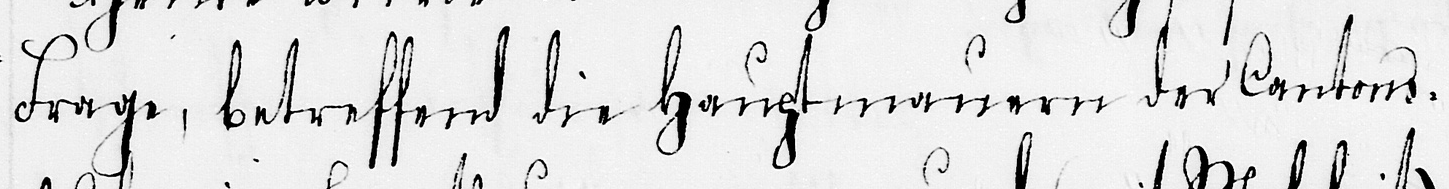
Frage, betreffend die Hauptmauern der Cantons¬
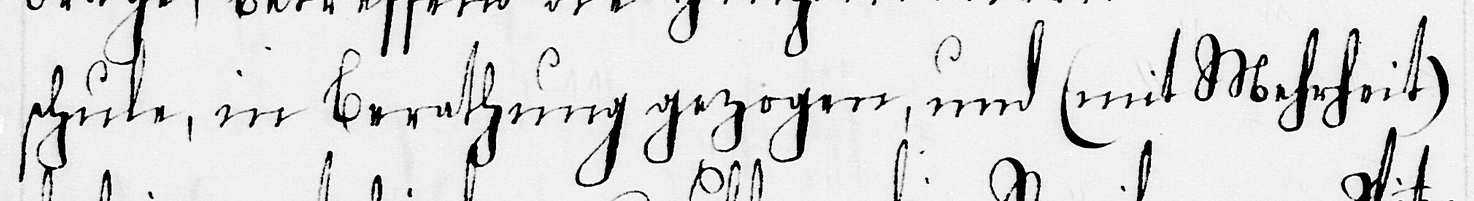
schule, in Berathung gezogen, und (mit Mehrheit)
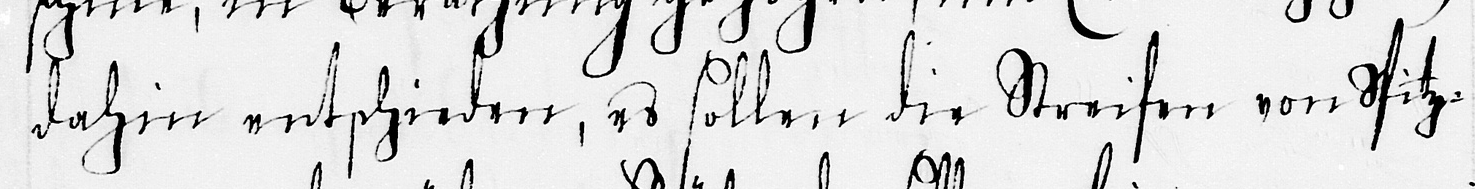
dahin entschieden, es sollen die Streifen von Spitz¬
